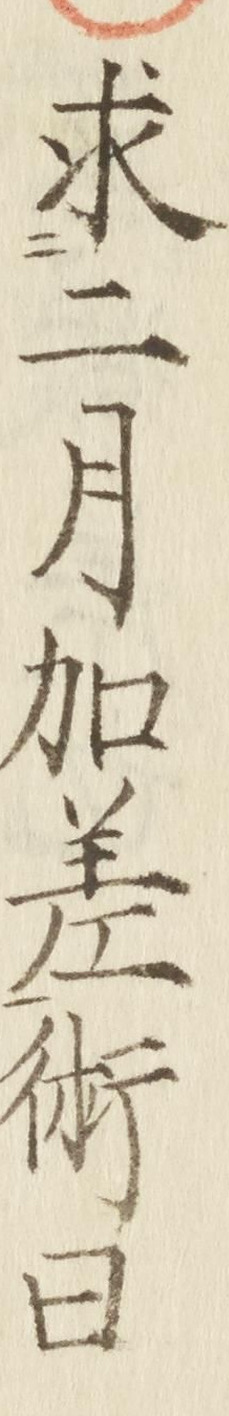○求二月加差術曰
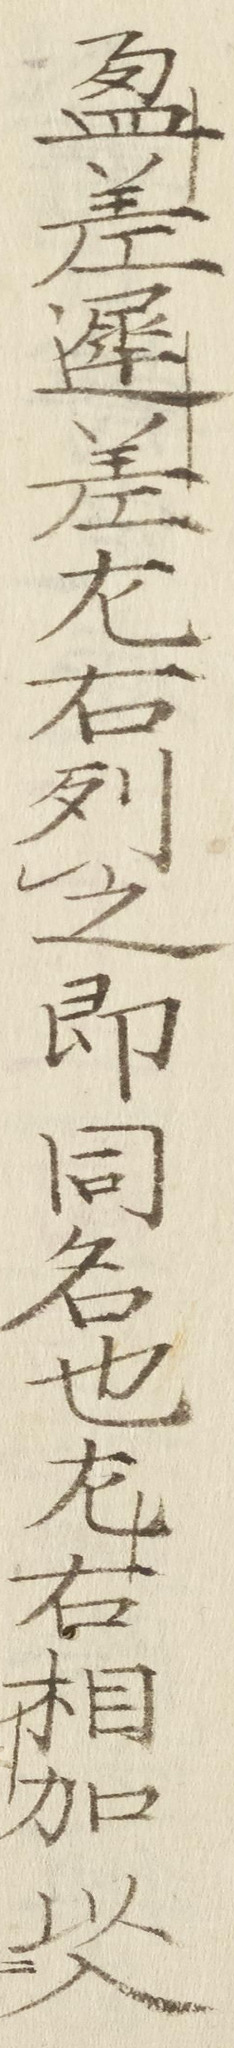盈差遅差左右列之即同名也左右相加以入
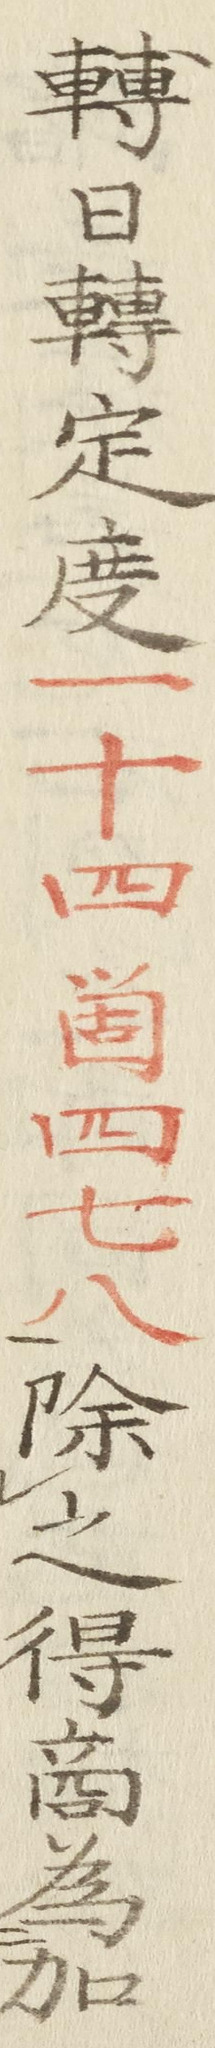転日転定度一十四箇四七八除之得商為加

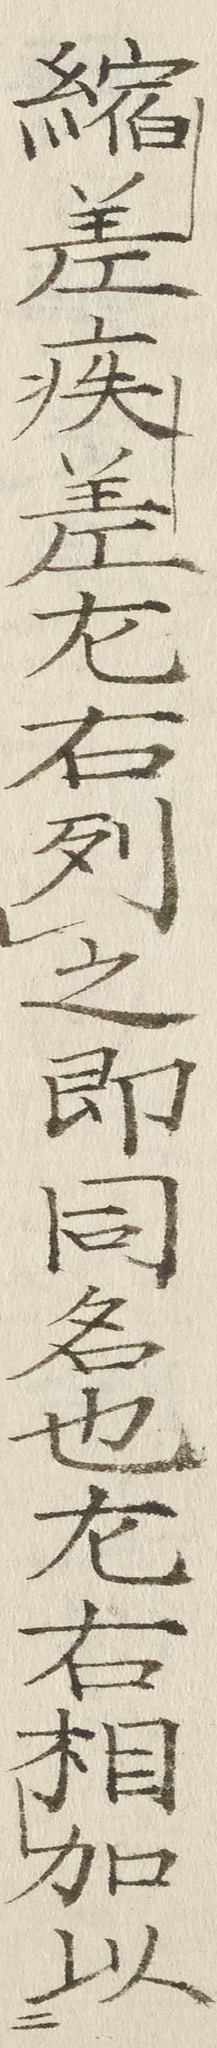縮差疾差左右列之即同名也左右相加以
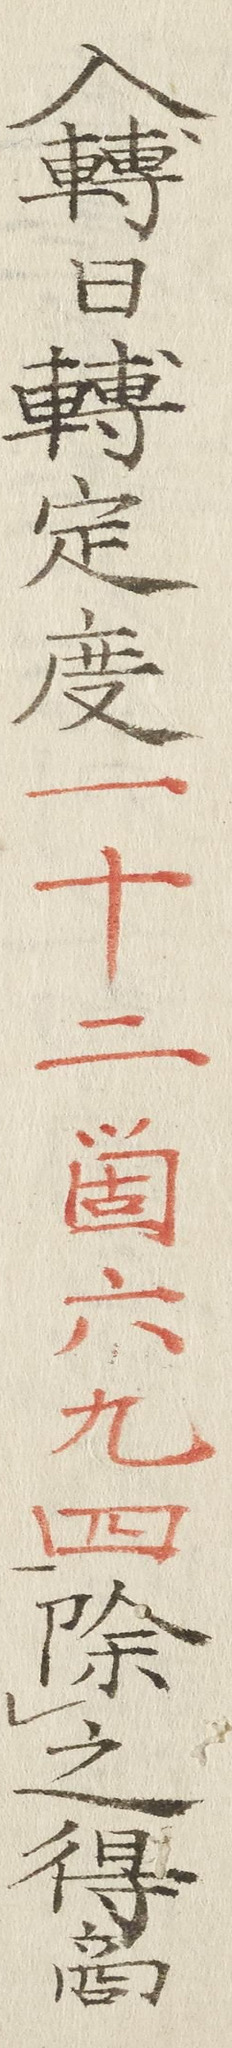入転日転定度一十二箇六九四除之得商
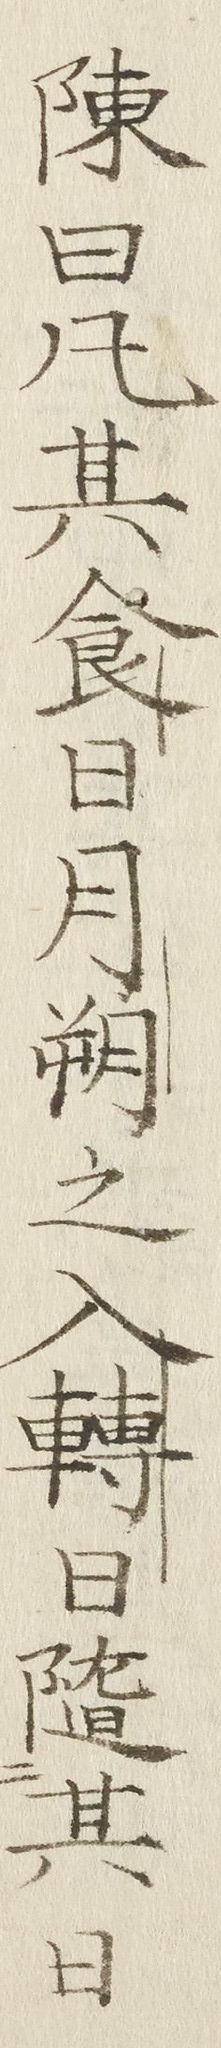陳曰凡其食日月朔之入転日随其日
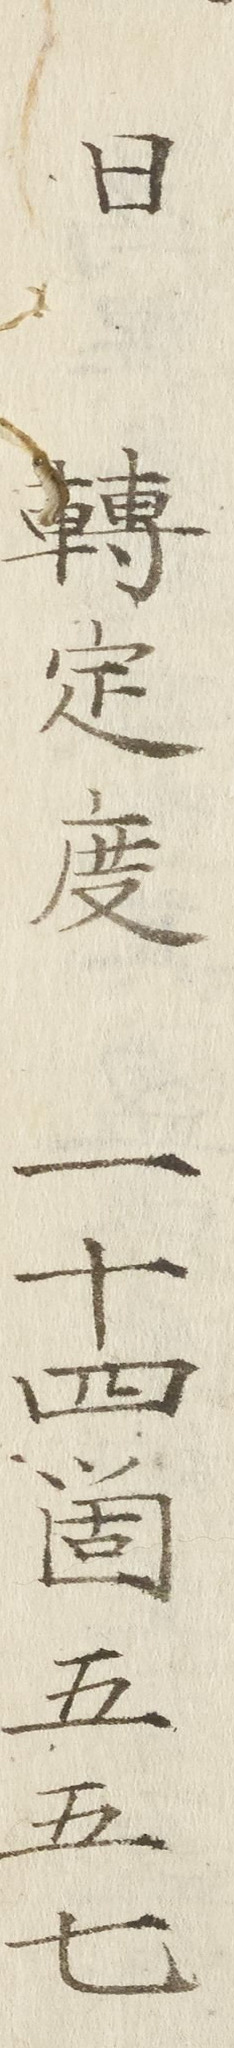一日転定度一十四箇五五七
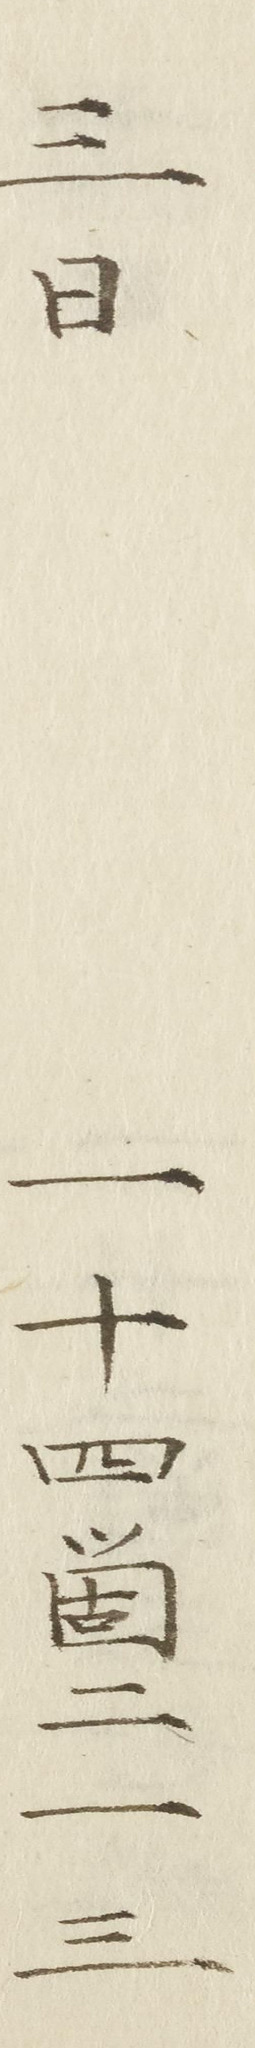三日一十四箇二一三
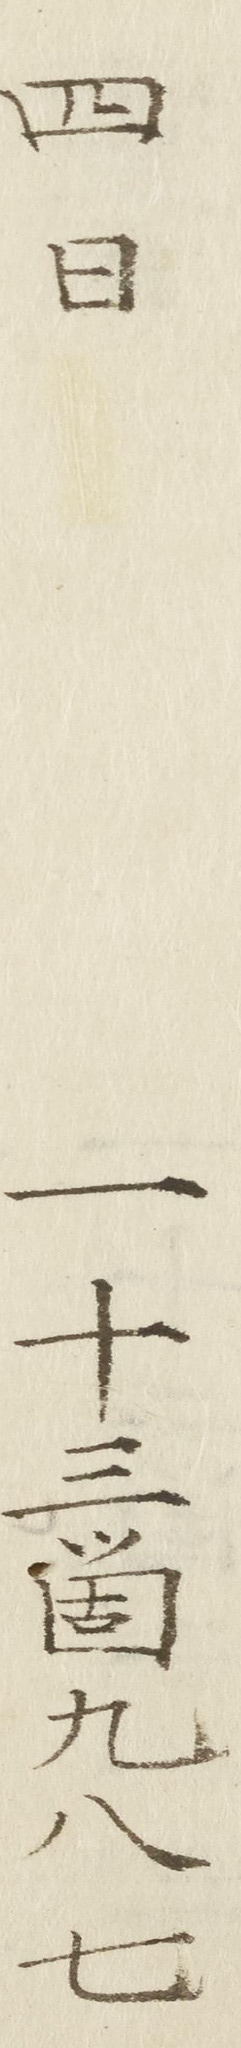四日一十三箇九八七
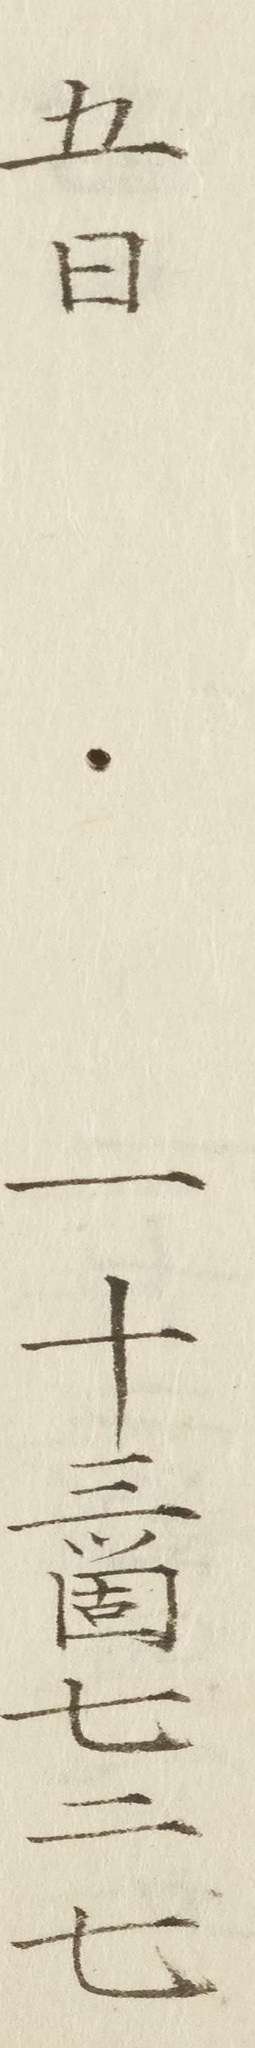五日一十三箇七二七
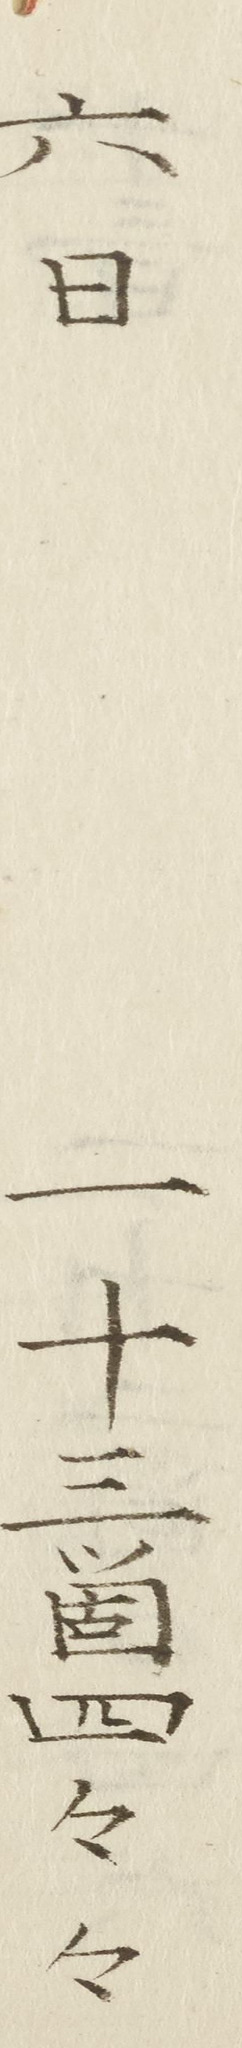六日一十三箇四々々

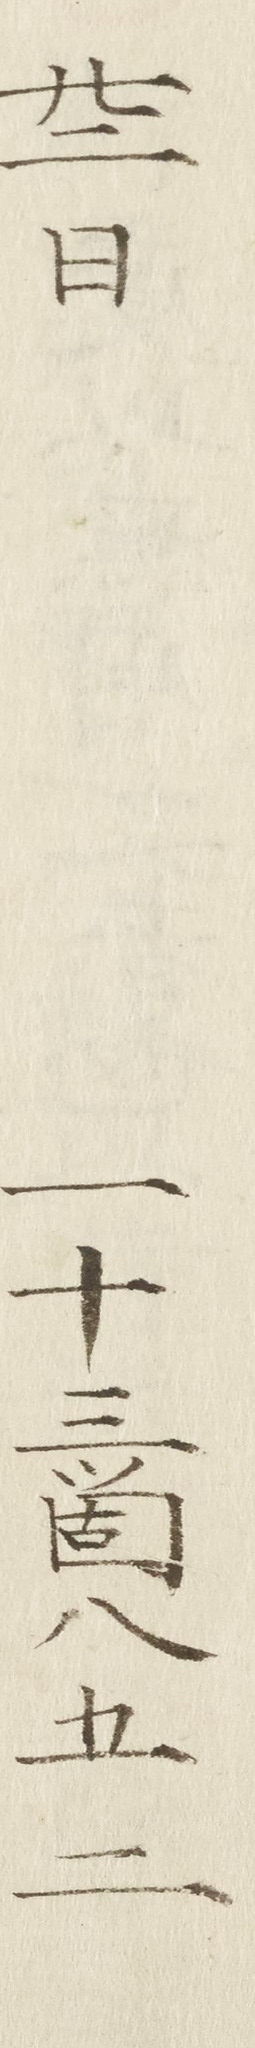廿二日一十三箇八五二
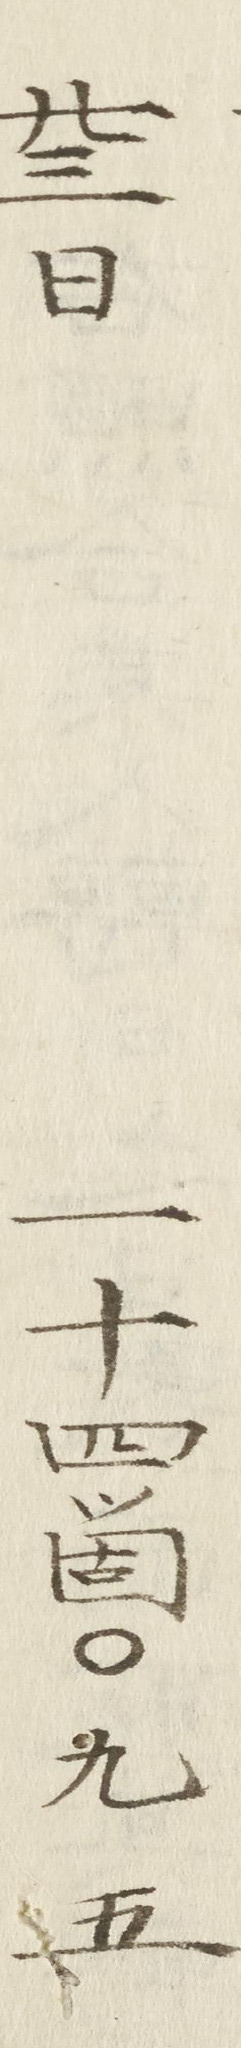廿三日一十四箇〇九五
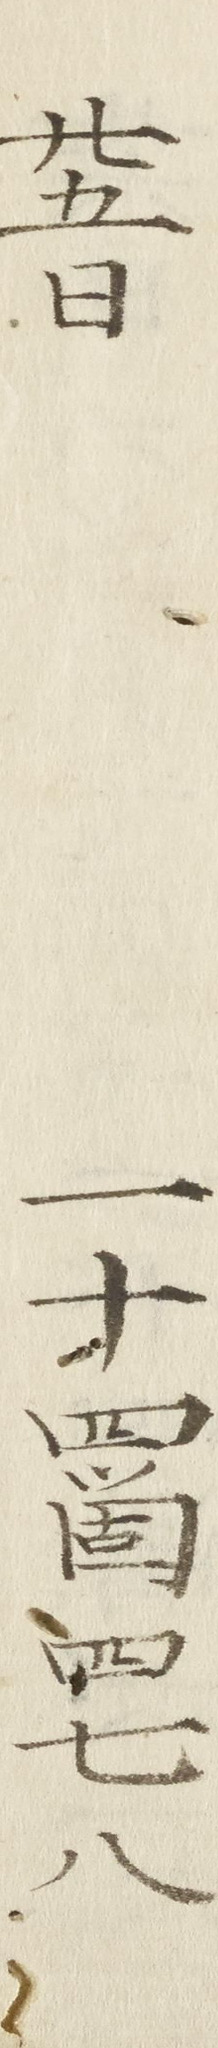廿五日一十四箇四七八

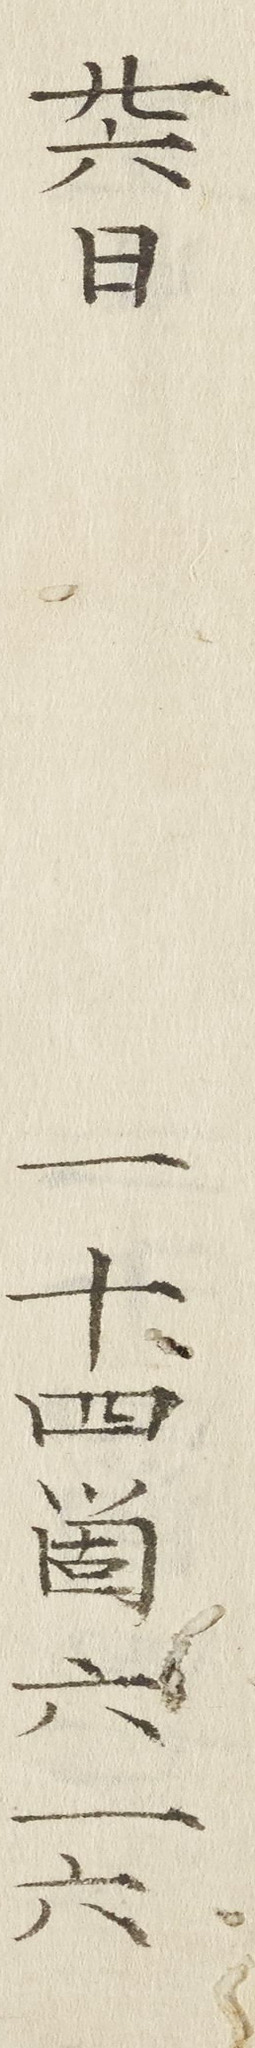廿六日一十四箇六一六
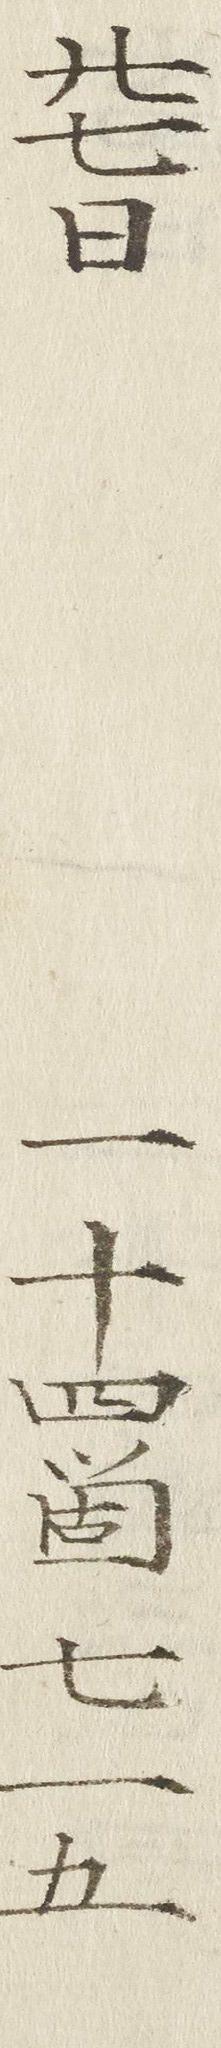廿七日一十四箇七一五
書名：日食度
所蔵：東京大学地震研究所図書室 Earthquake Research Institute Library, The University of Tokyo, JAPAN
